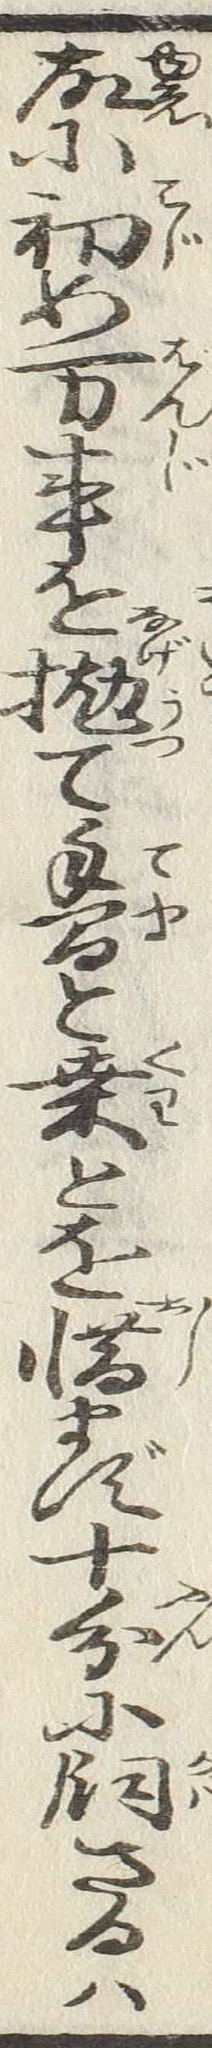故に初め万事を抛て手間と桑とを惜まず十分に飼さるは
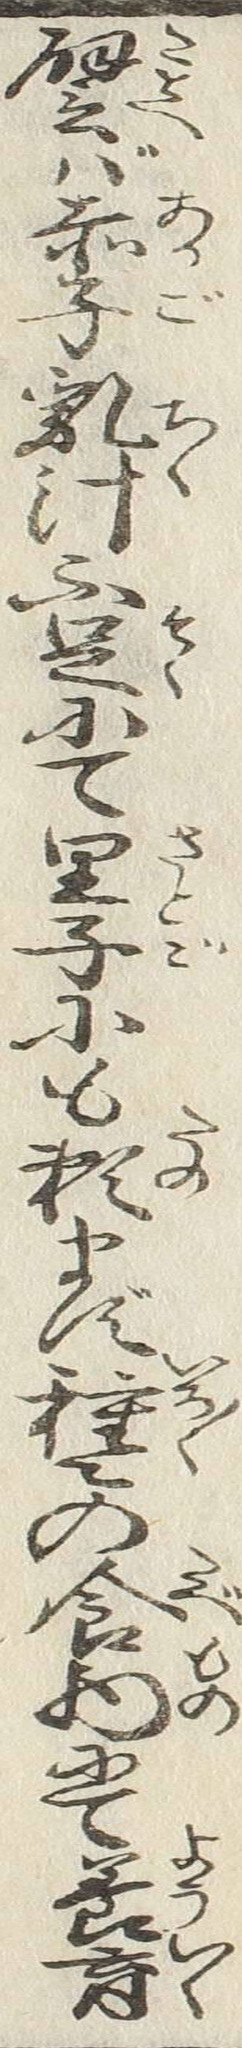譬ば赤子乳汁ふ足にて里子にも頼まず種々の食物にて養育
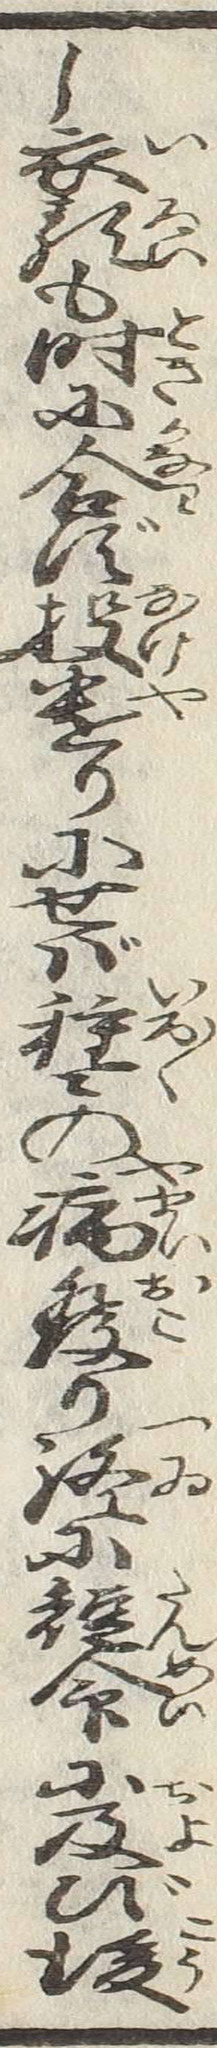し衣類も時に合ず投遣りにせば種々の病發り終に短命に及び後

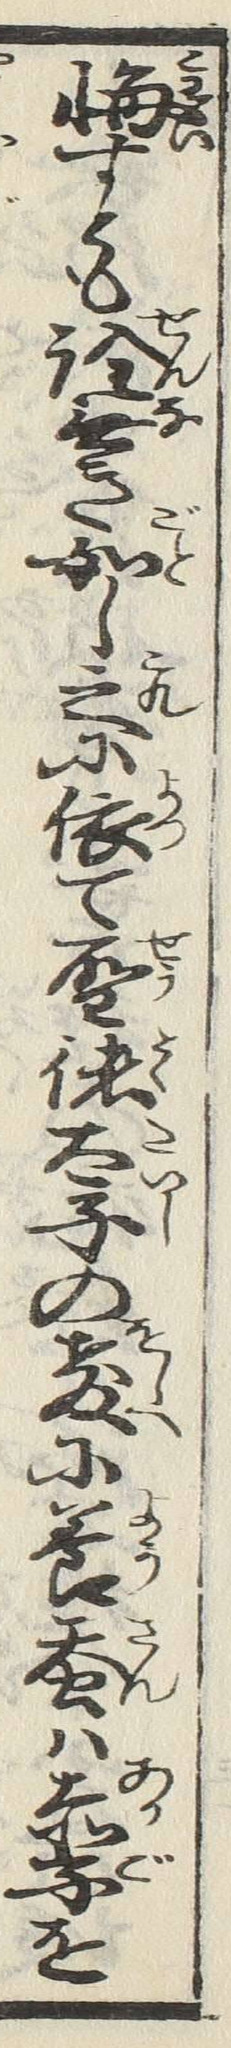悔すとも詮無き如し之に依て聖徳太子の教に養蚕は赤子を
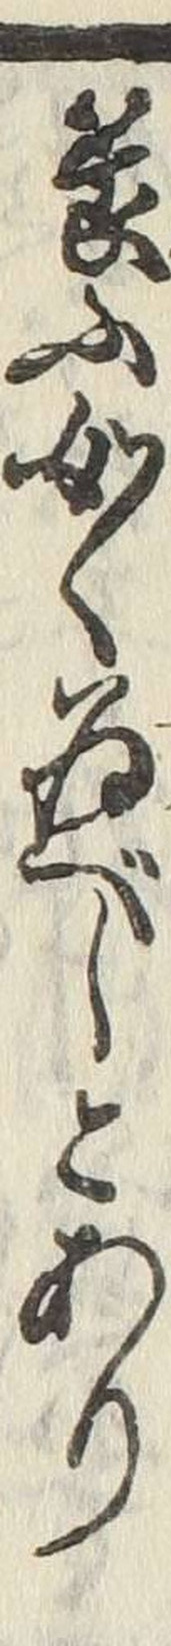養ふ如く為べしとあり
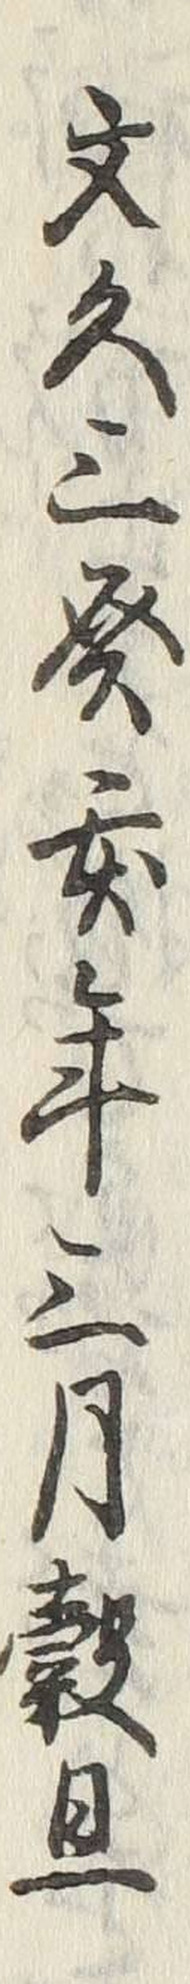文久三癸亥年三月穀旦
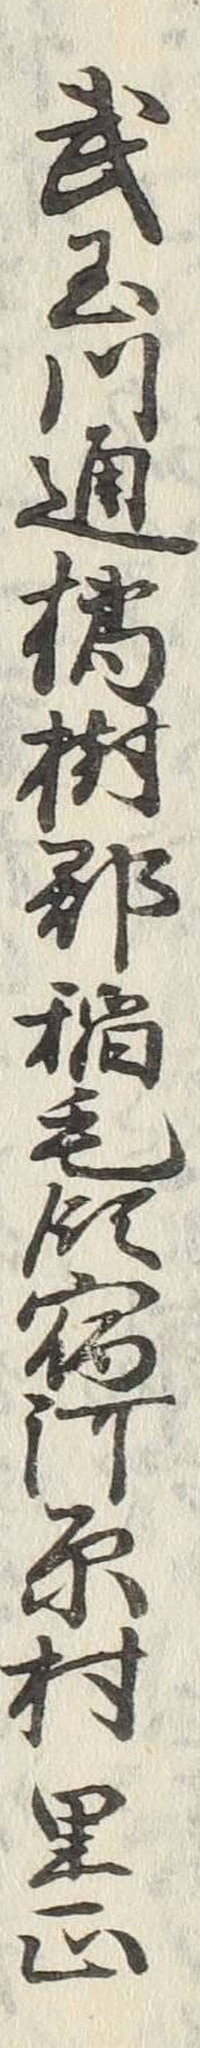武玉川通橘樹郡稲毛領宿河原村里正
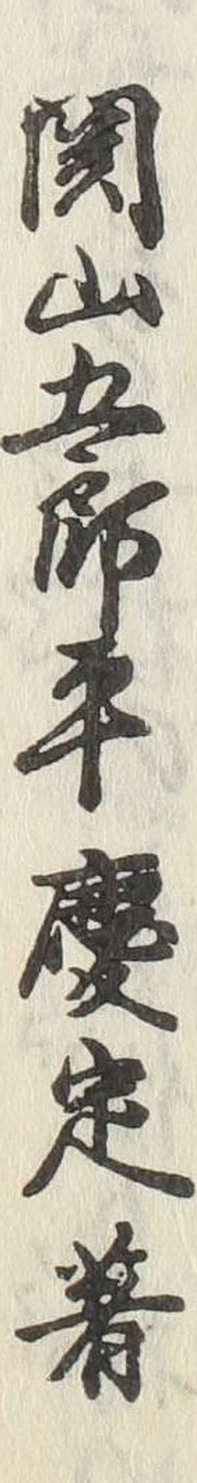関山五郎平慶定著
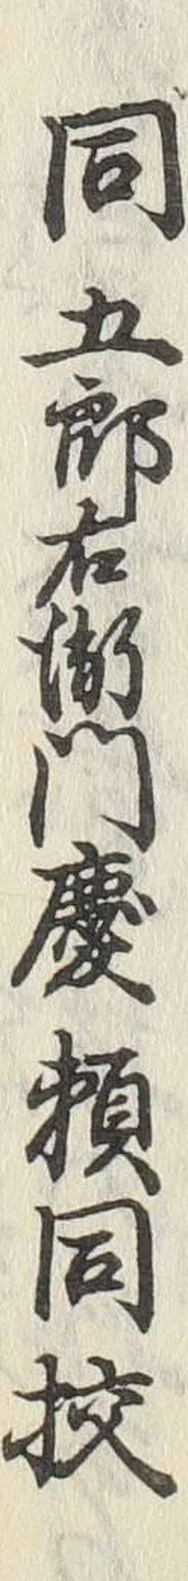同五郎右衛門慶頼同挍
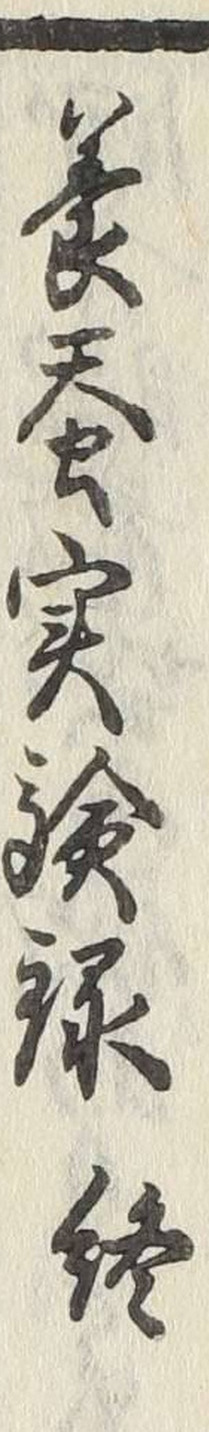養蚕実験録終
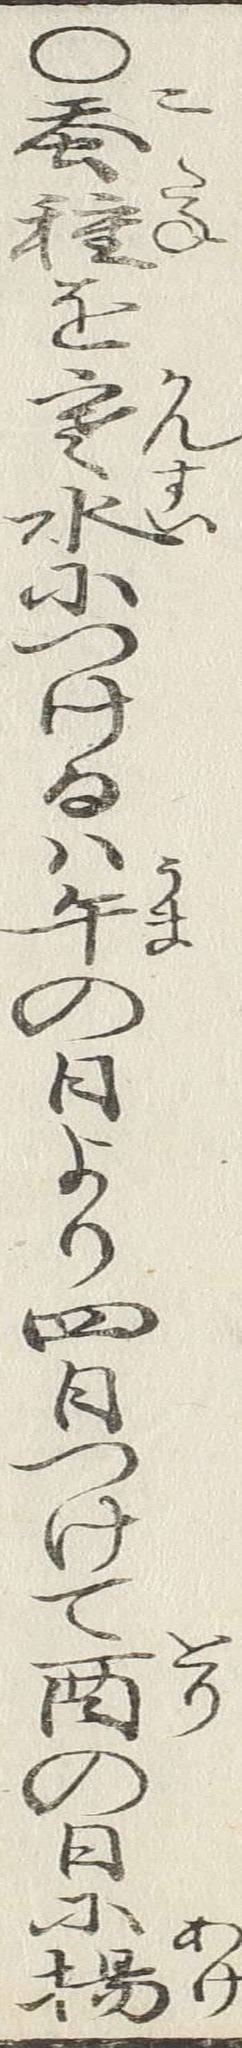○蚕種を寒水につけるは午の日より四日つけて酉の日に揚
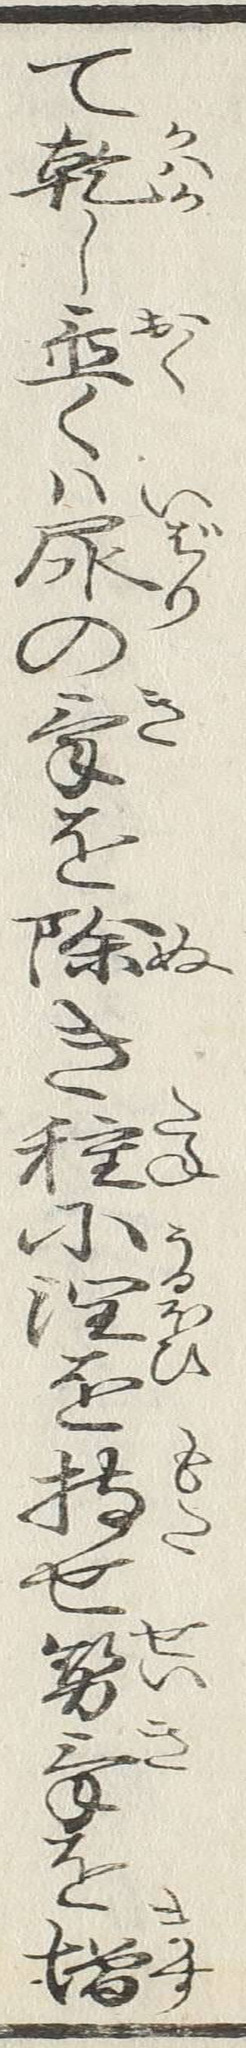て乾し置くは尿の気を除き種に潤を持せ勢気を増
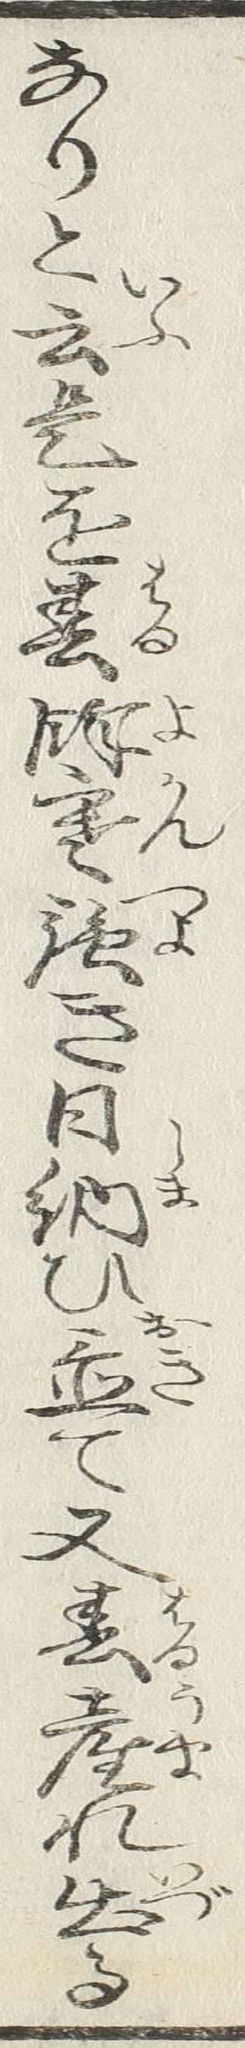なりと云是を春餘寒強き日納ひ置て又春産れ出る
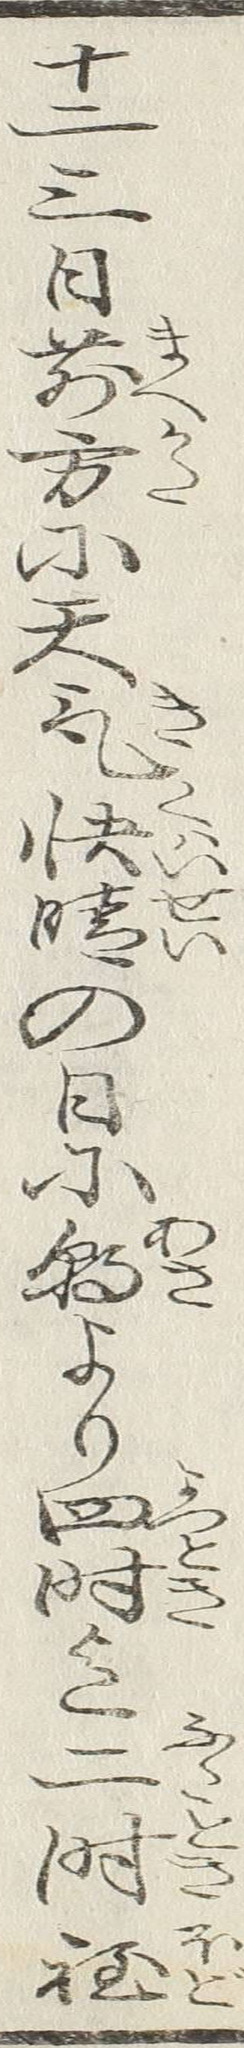十二三日前方に天気快晴の日に朝より四時迄二時程
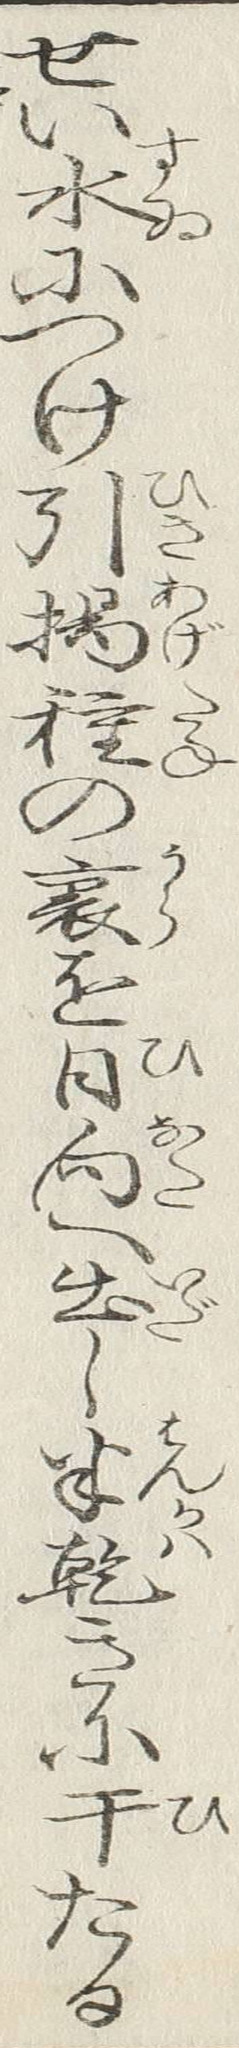せい水につけ引揚種の裏を日向へ出し半乾きに干たる
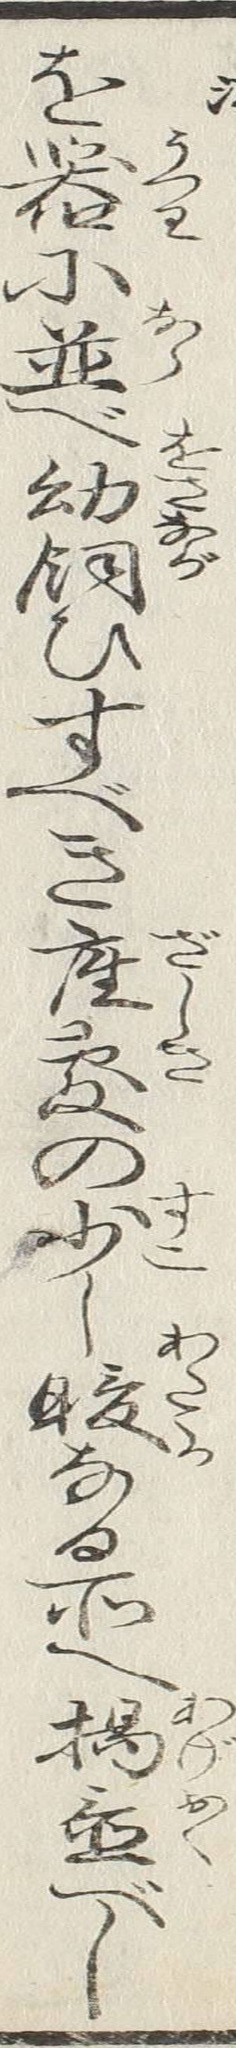を器に並べ幼飼ひすべき座敷の少し暖なる所へ揚置べし
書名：養蠶實驗録
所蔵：東京大学農学生命科学図書館 国文学研究資料館
